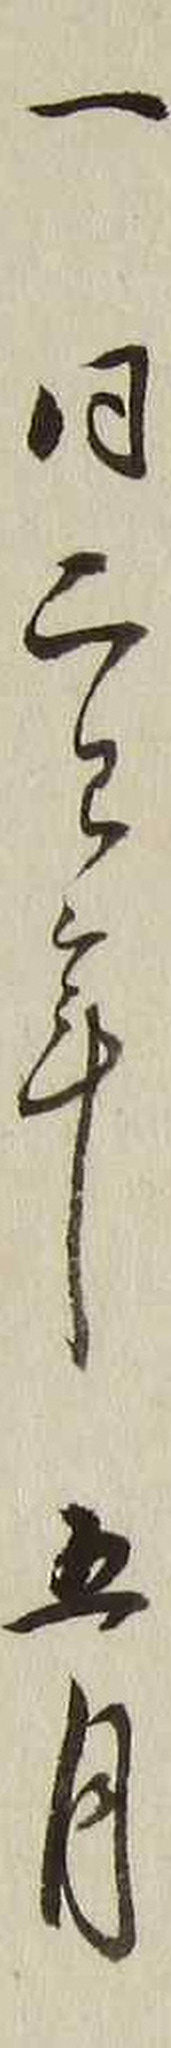一同二巳年五月
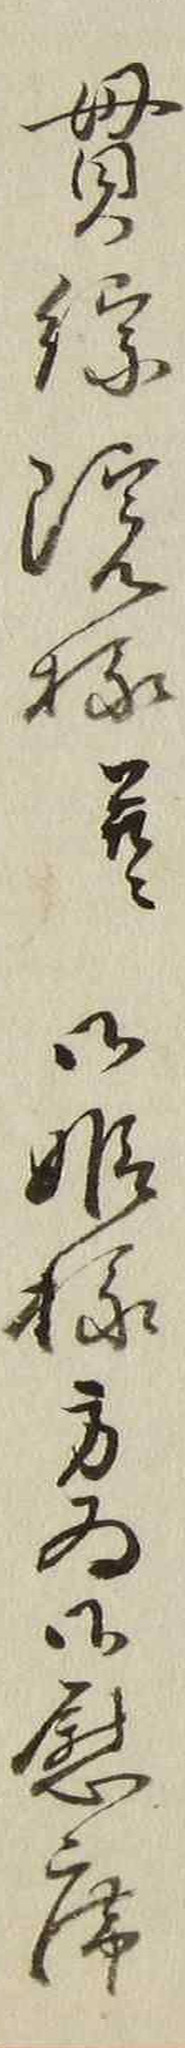貫綜院様并ニ御姫様方為御慰席
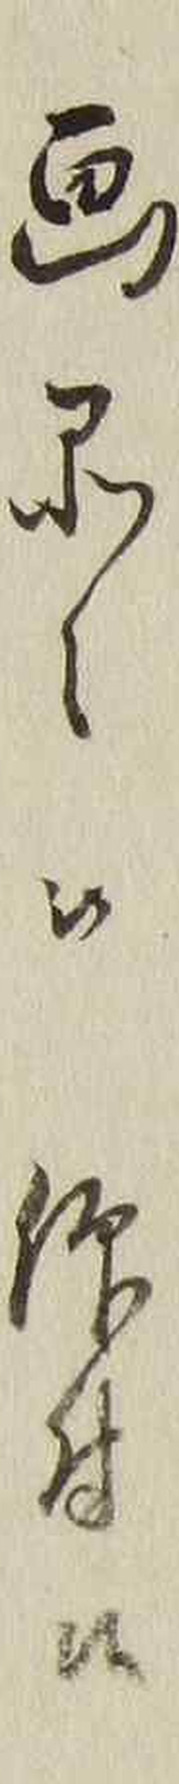画品々被仰付候
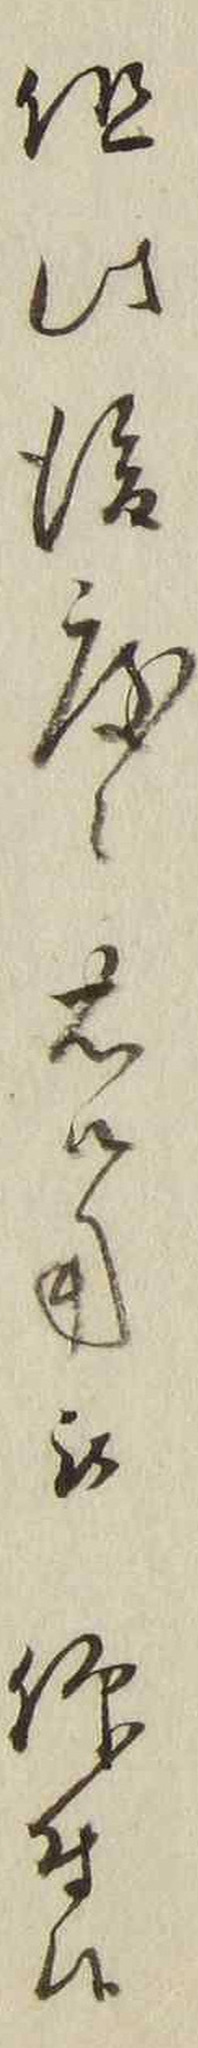但此後度々右御用被仰付候

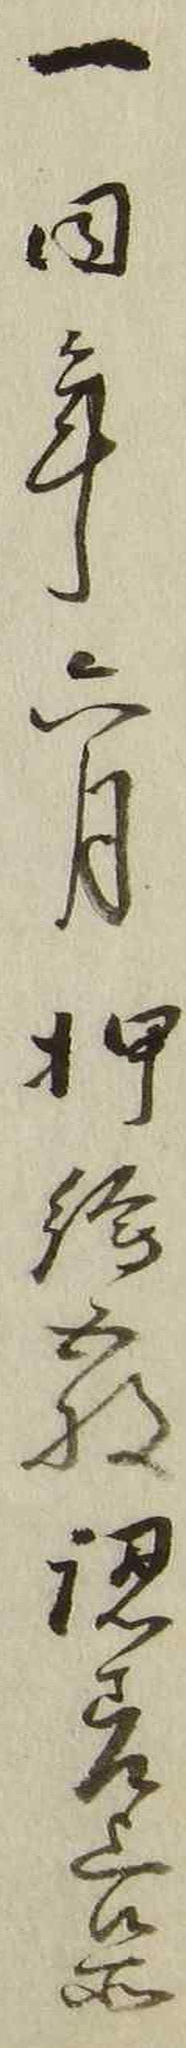一同年六月押絵五枚認差上候所
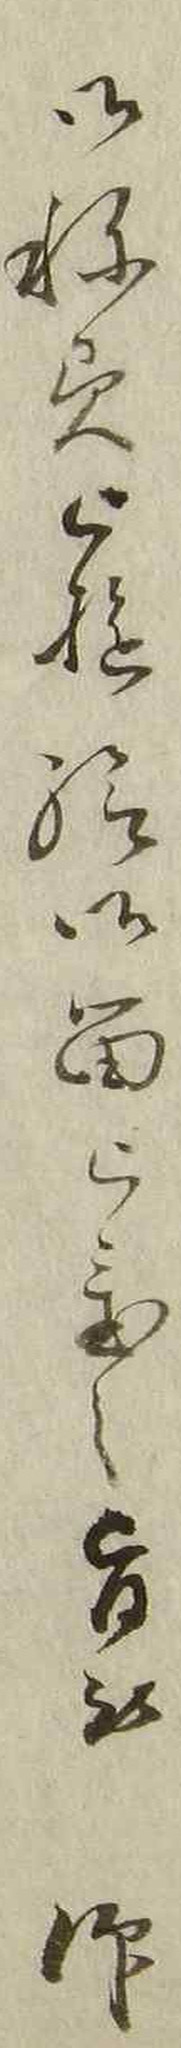御称美被遊絵御留被置之旨被仰
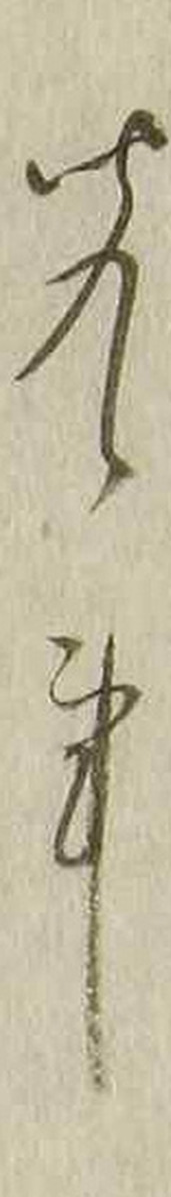聞候事
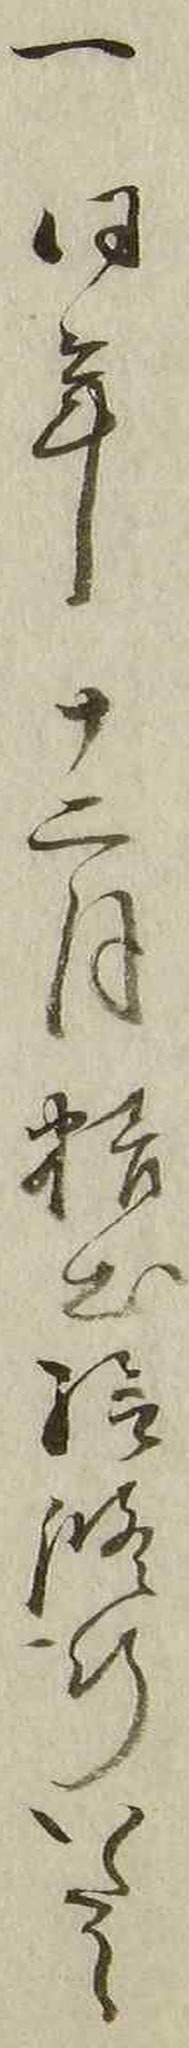一同年十二月精出絵修行いたし
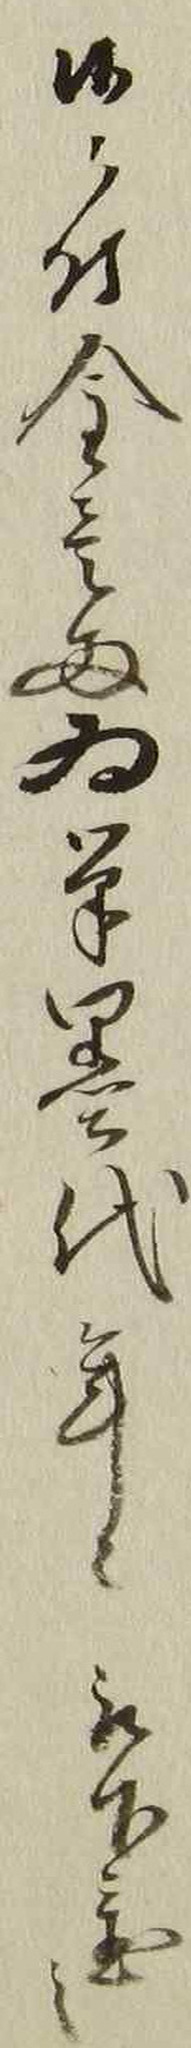候ニ付金壱両為筆墨代年々被下置之
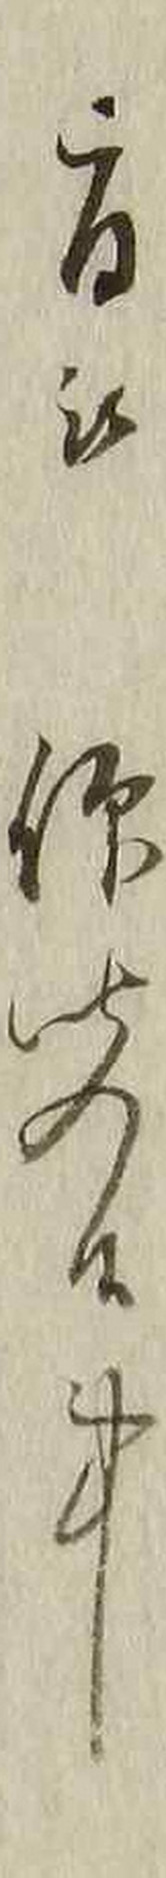旨被仰聞候事
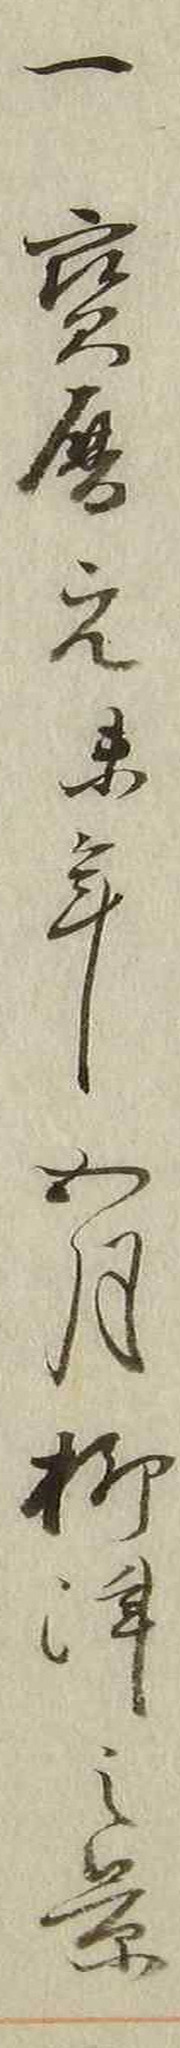一宝暦元未年五月柳津之景
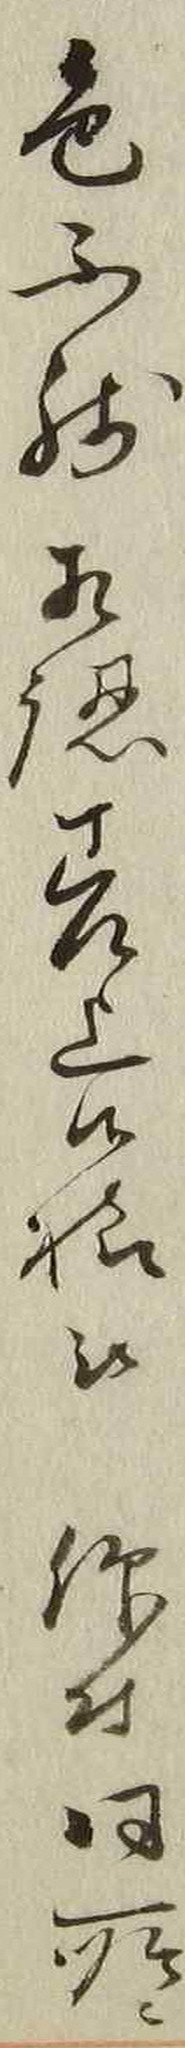色不残相認差上候様被仰付同所ニ
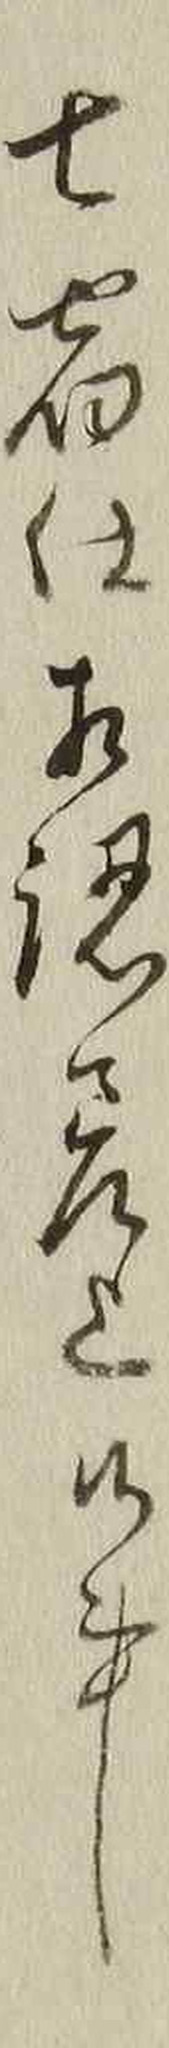七宿仕相認差上候事
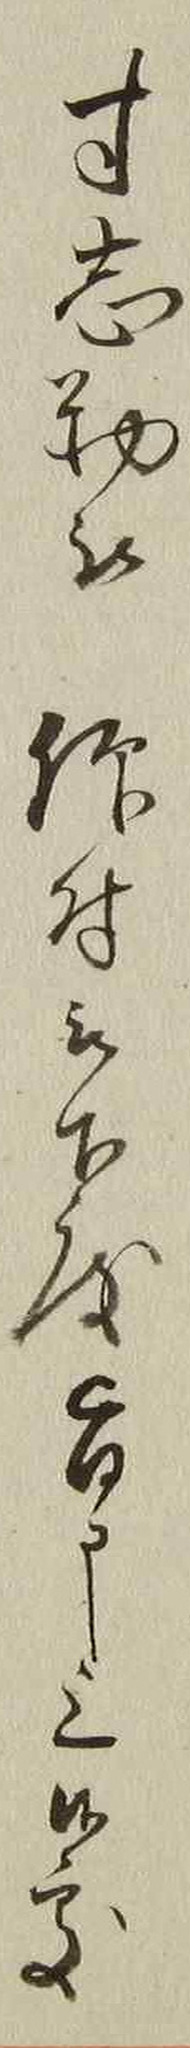寸志勤被仰付被下度旨申上候処
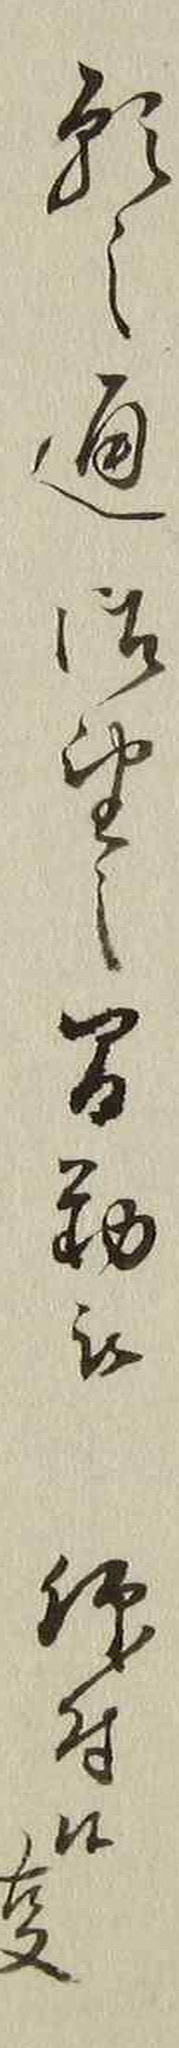願之通御座之間勤被仰付候事
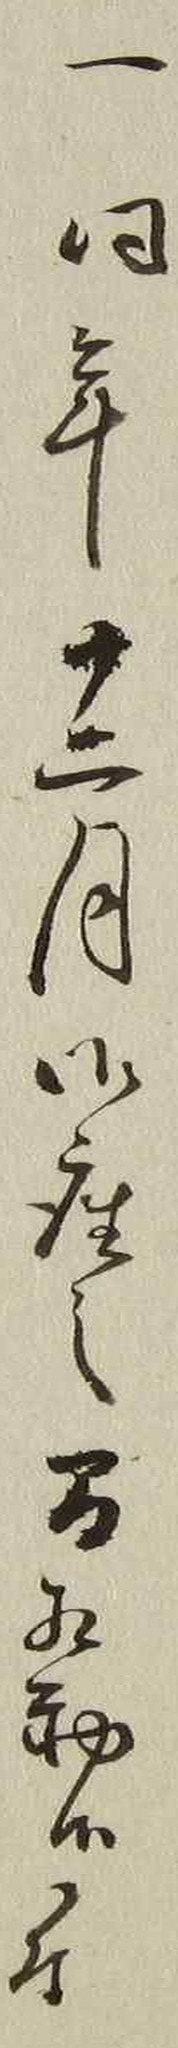一同年十二月御座之間相勤候ニ付
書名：諸士系譜　巻之132　た之部8
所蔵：会津若松市立会津図書館
